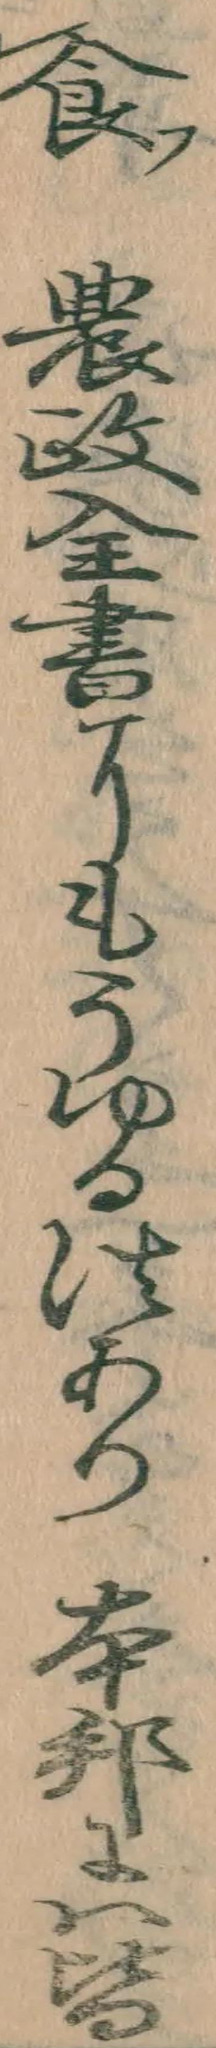食農政全書にもうゆる法あり本邦には皆
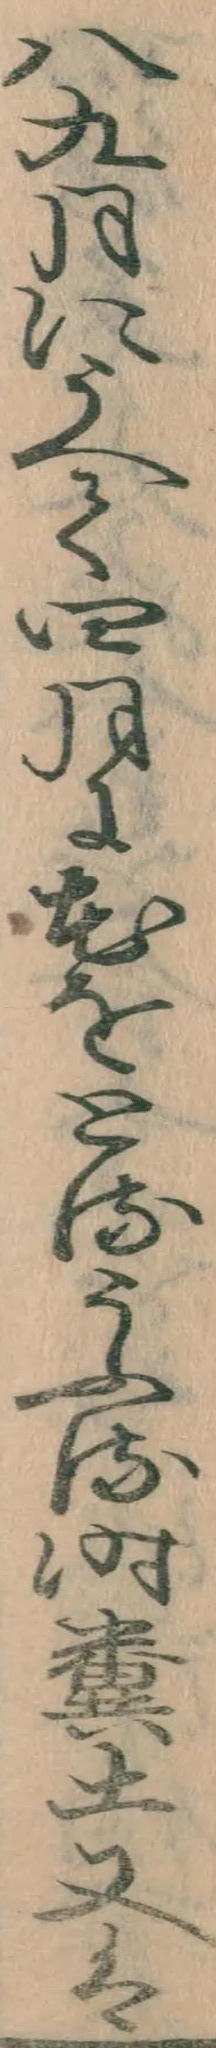八九月にうへて四月に花をとるうふる時糞土又は
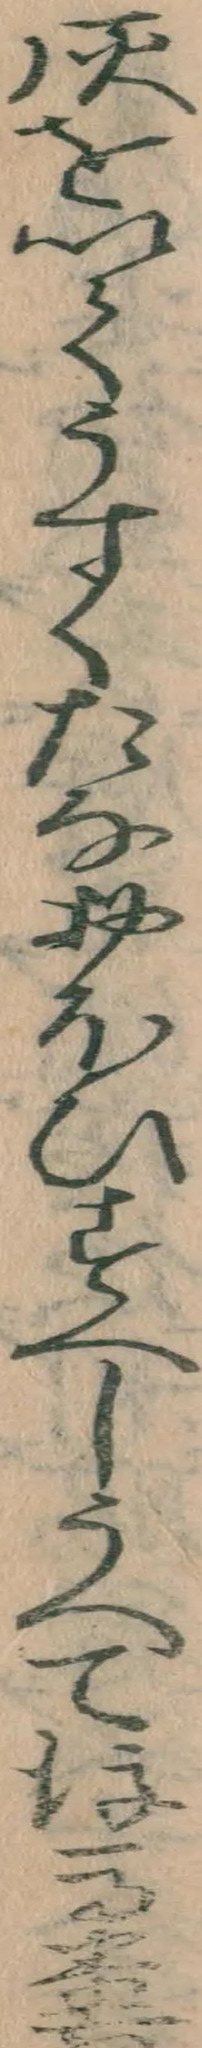灰を以てうすくたなおほひすへしうへて後馬糞
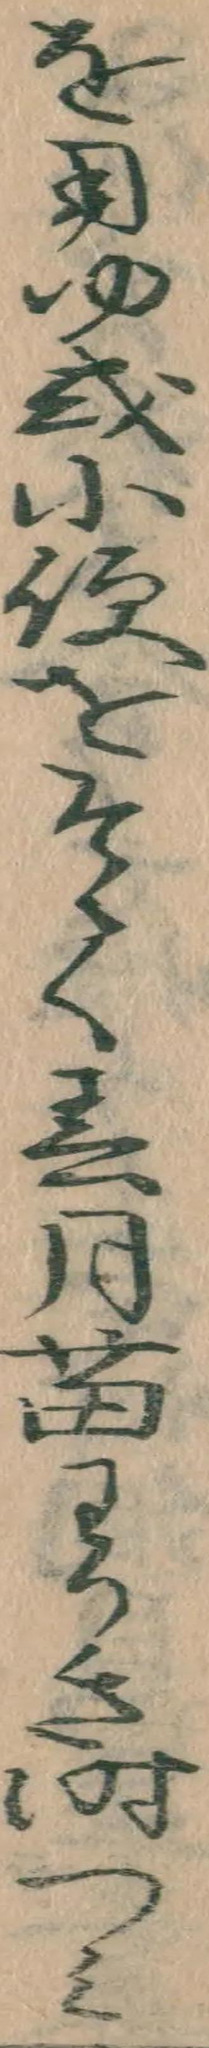を用ゆ或小便をそゝく春月苗わかき時つみ
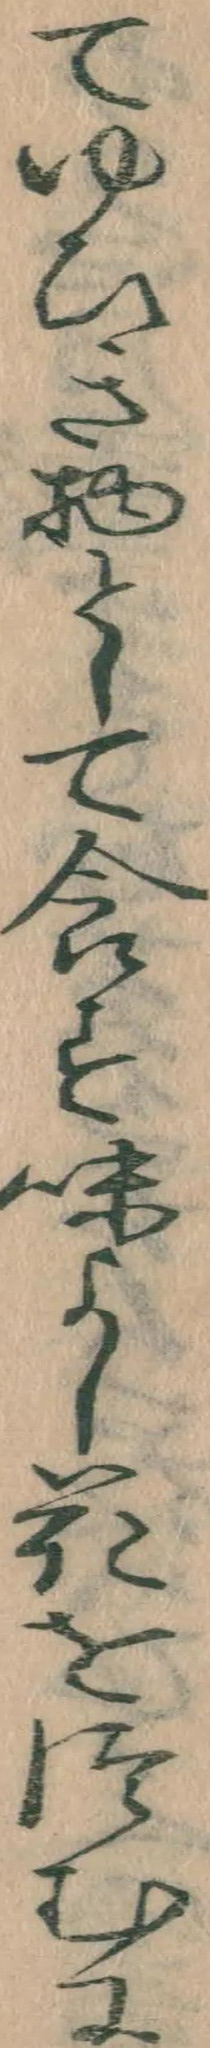てゆひき物として食す味よし花をつむに
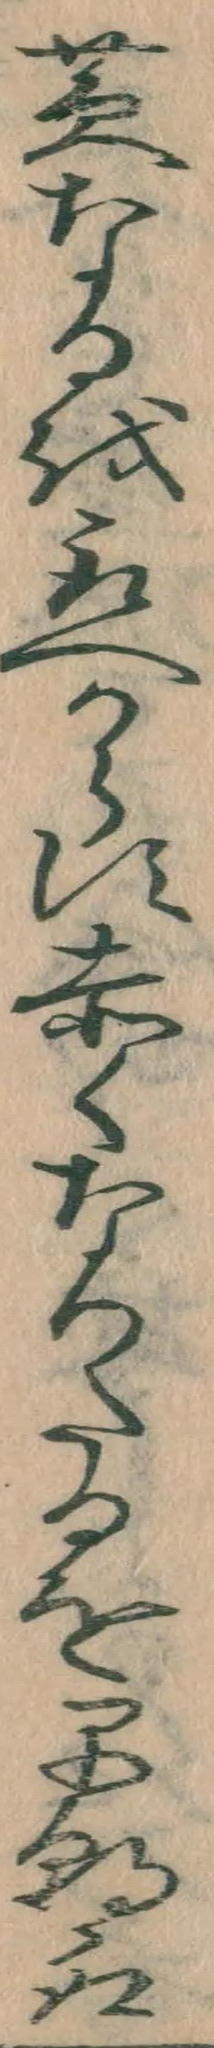黄なるを取へからす赤くなりたるを早朝取
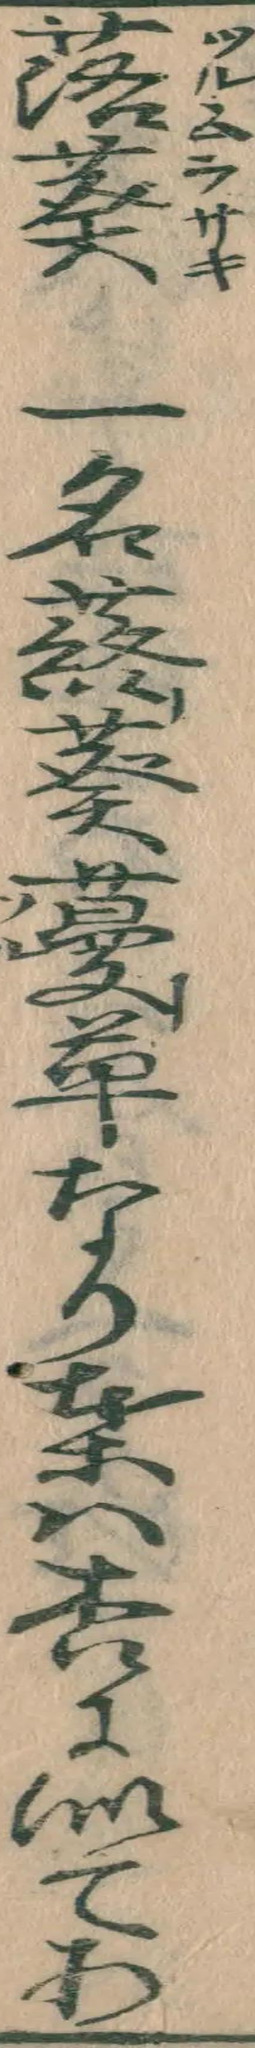落葵一名蔠-葵蔓-草なり葉は杏に似てあ
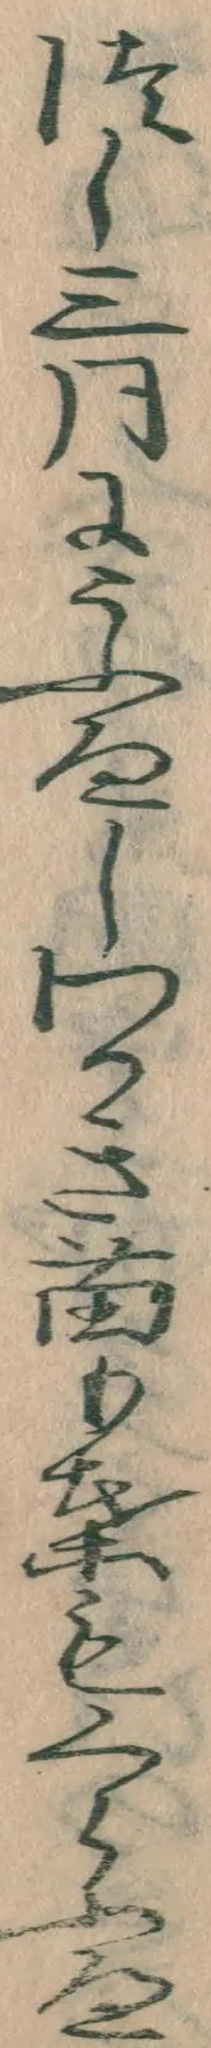つし三月にうふへしわかき苗も葉もくらふへ
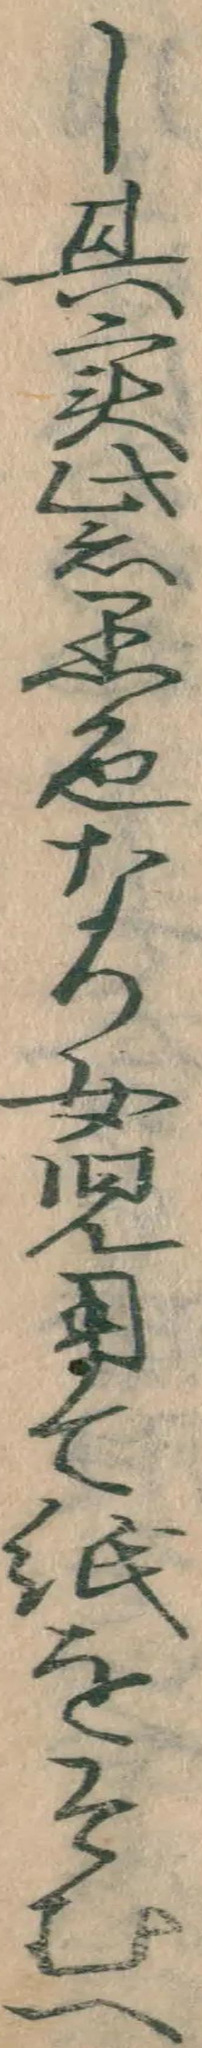し其実紫黒色なり女児用て紙をそむへ
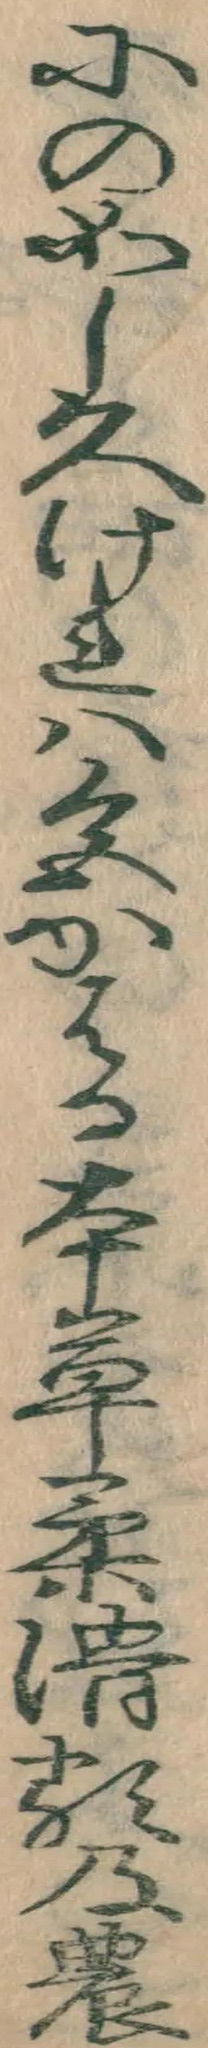にの如し久けれは色かはる本草柔滑類の農
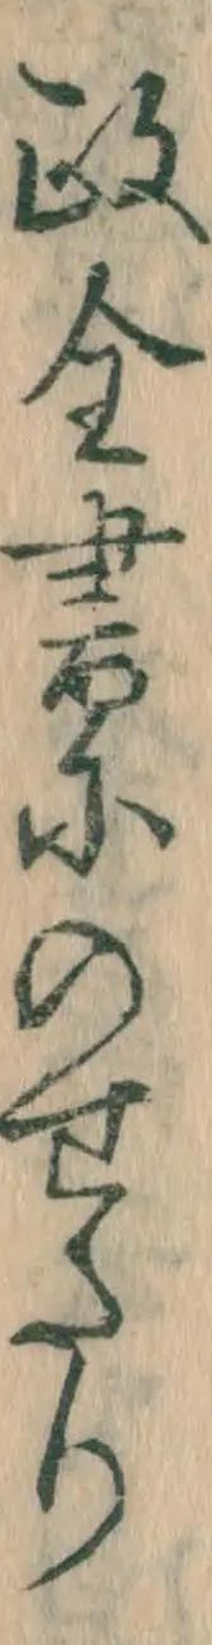政全書にのせたり

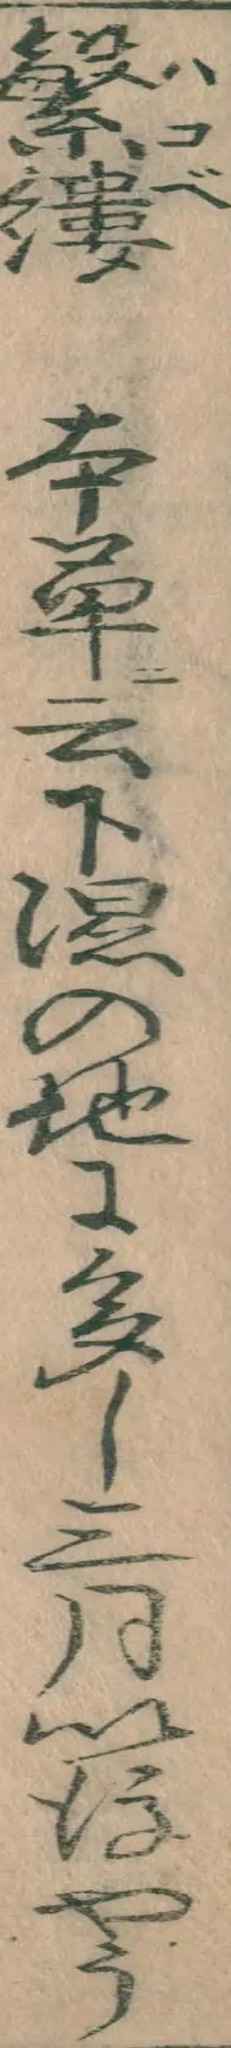繁縷本草云下湿の地に多し三月以後やう
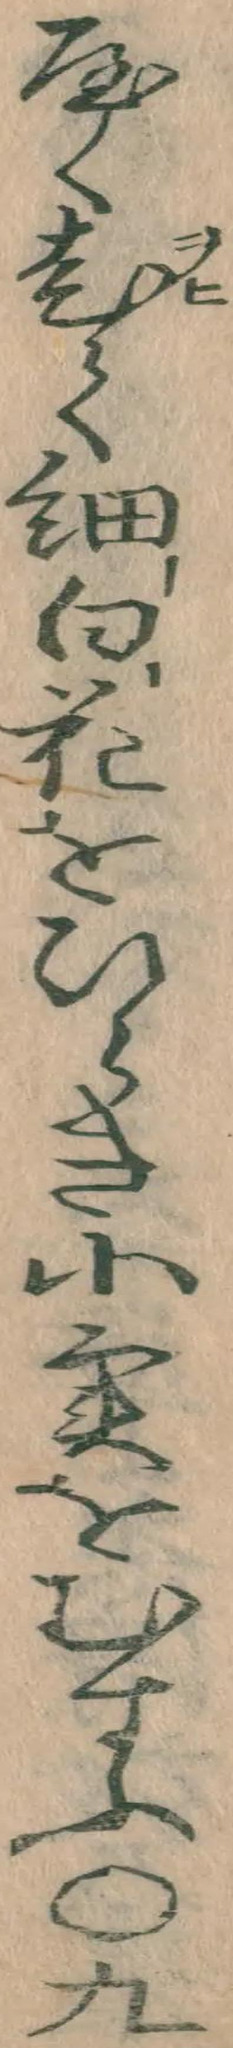やく老て細-白-花をひたき小実をむすふ〇九
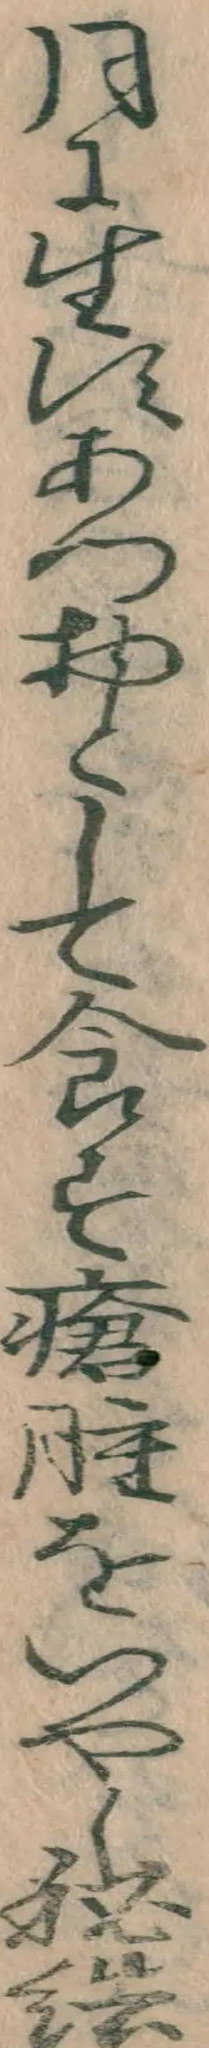月に生すあつ物として食す瘡腫をいやし秘結
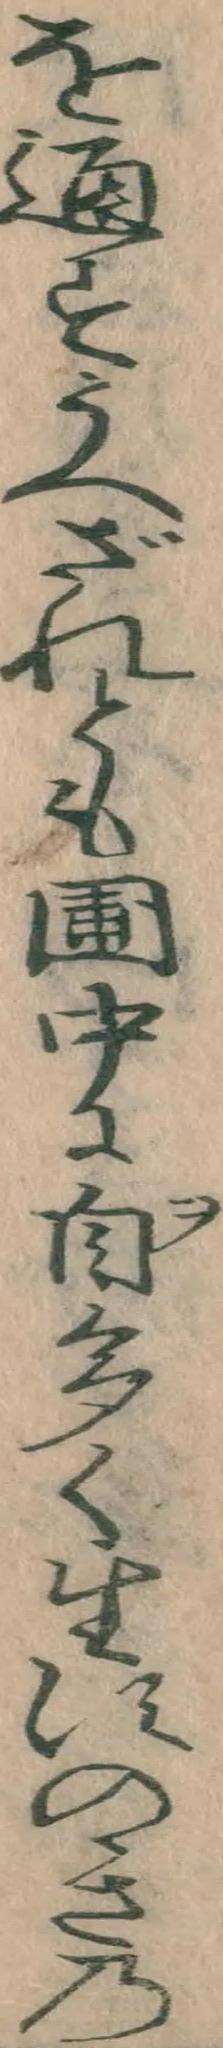を通すうへざれとも圃中に自多く生すのきの
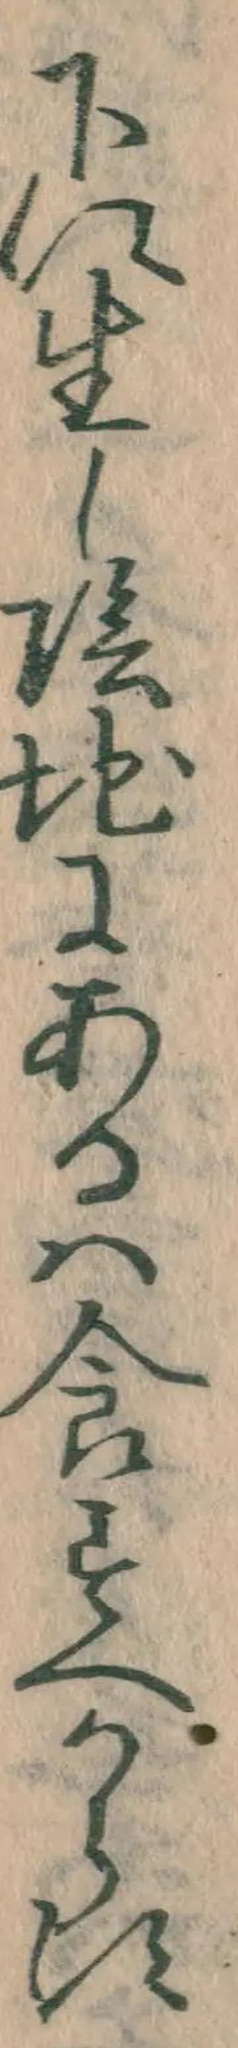下に生し陰地にあるは食すへからす
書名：菜譜 3巻
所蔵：国立国会図書館 National Diet Library, JAPAN
